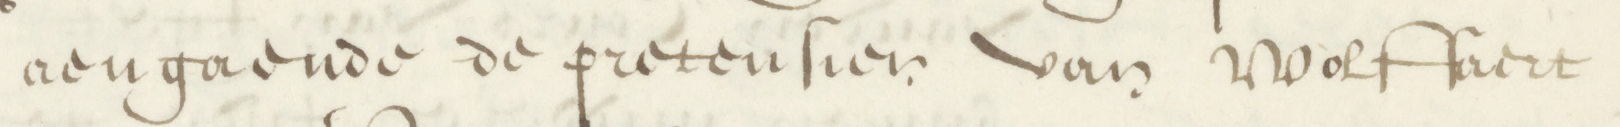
aengaende de pretensien van Wolffaert
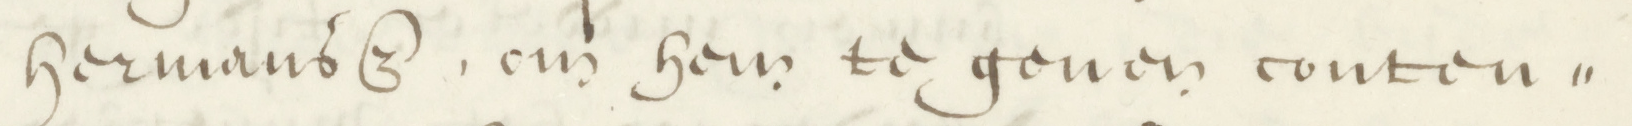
hermansz, om hem te geuen conten,,
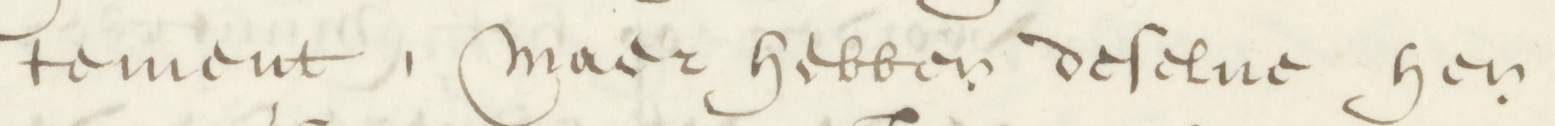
tement, maer hebben deselue hen
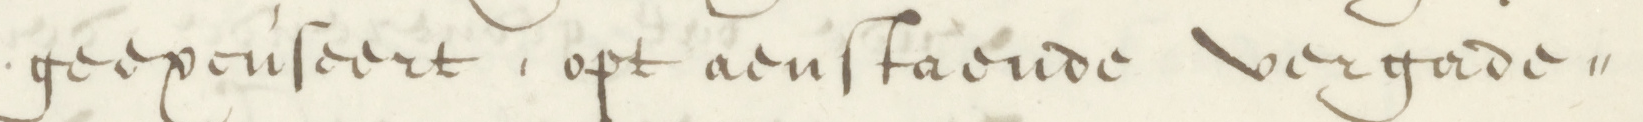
geexcuseert, opt aenstaende vergade,,
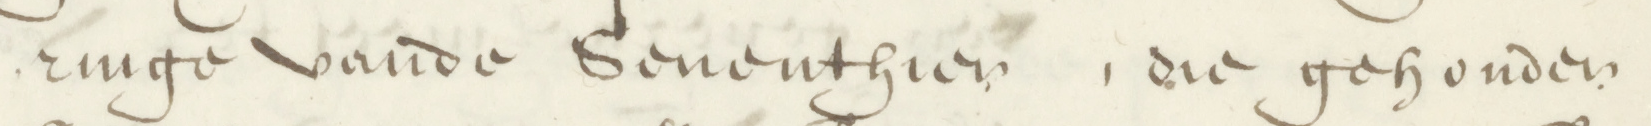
ringe vande Seuenthien, die gehouden
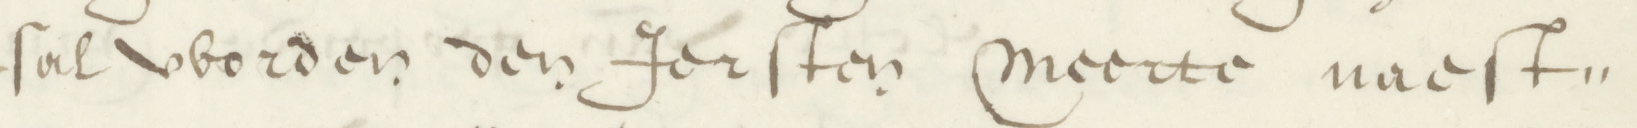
sal worden den Iersten meerte naest,,
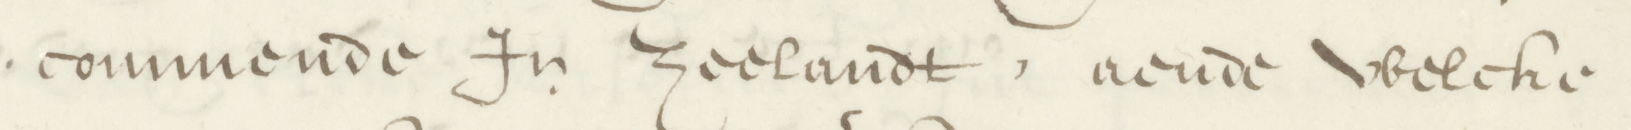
commende In Zeelandt, aende welcke
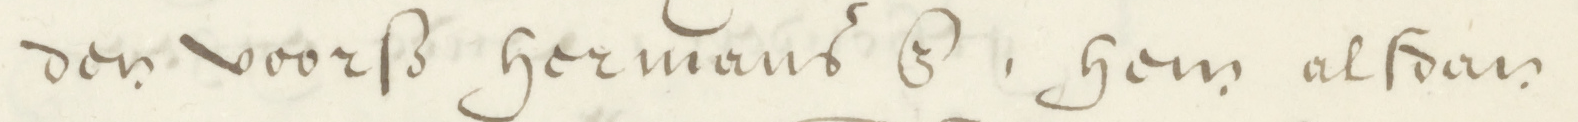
den voors hermansz, hem alsdan
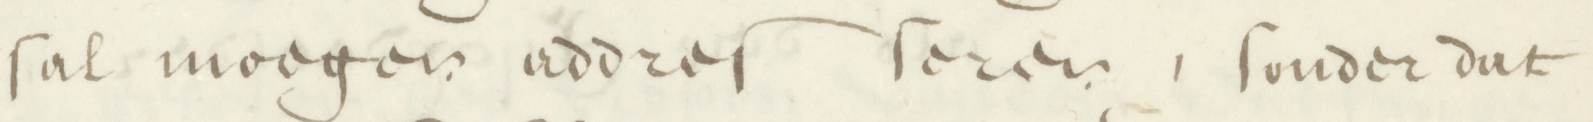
sal moegen addresseren, sonder dat
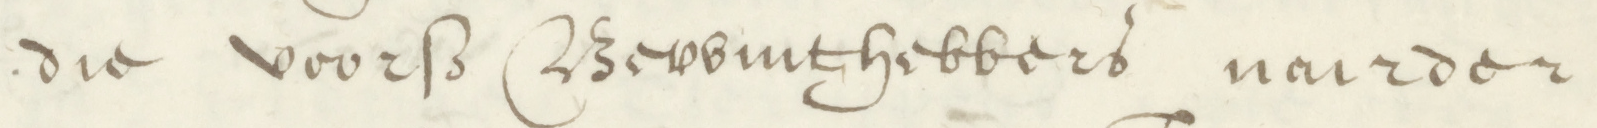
die voors Bewinthebbers nairder
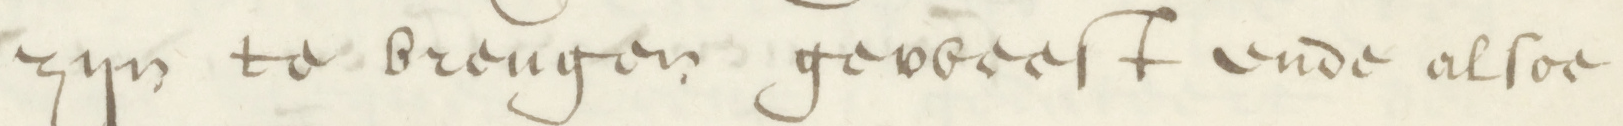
zyn te brengen geweest ende alsoe
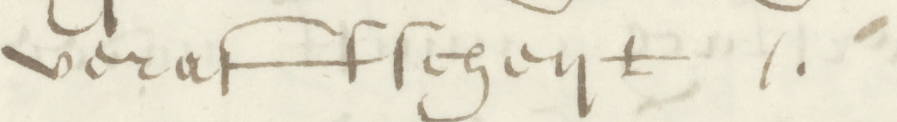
veraffscheyt.
